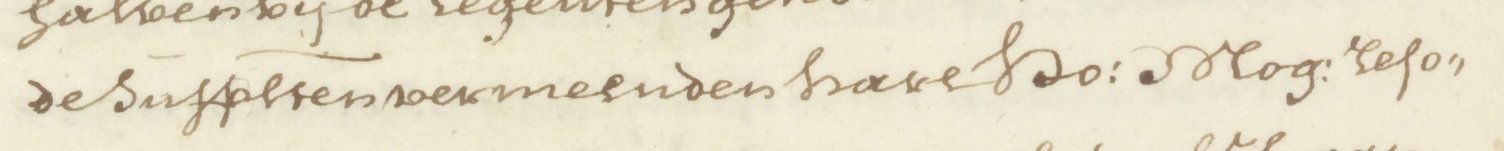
de supplten vermeenden hare Ho:Mog: reso,,
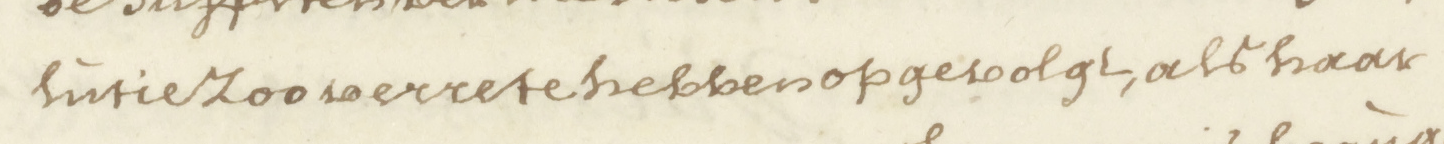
lutie zooverre te hebben opgevolgt, als haar
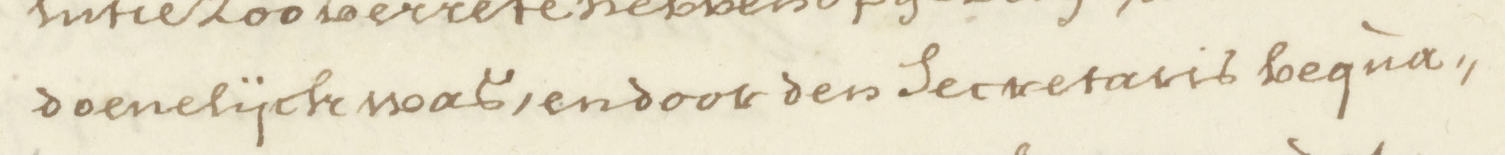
doenelijck was, endoor den secretaris bequa„
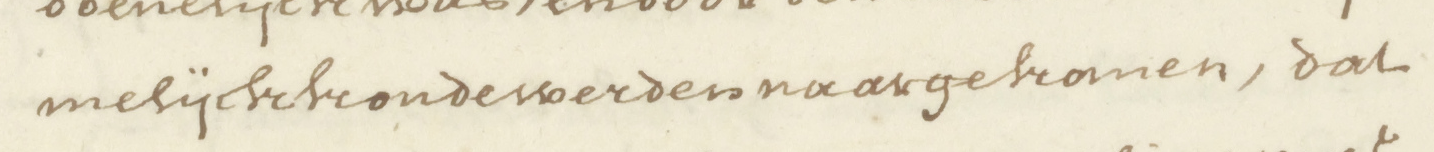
melijckkonde werden naargekomen, dat
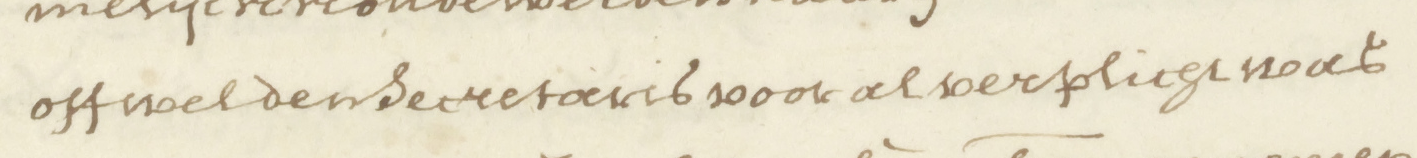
offwel den secretaris voor al verplicht was
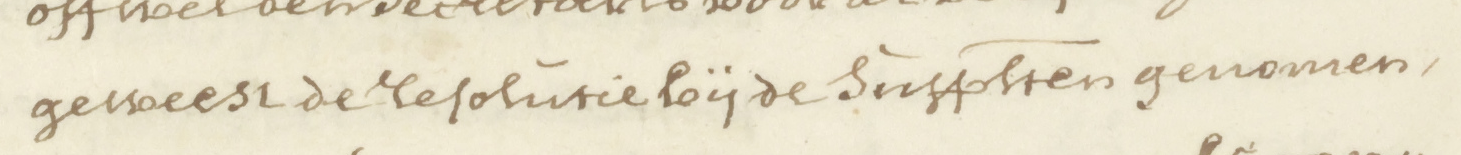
geweest de resolutie bij de supplten genomen,
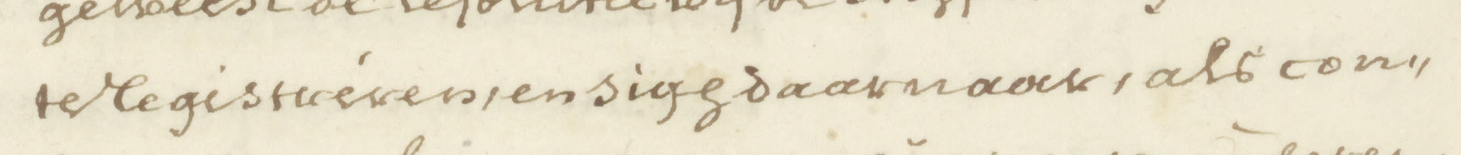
te registreren, en sigh daarnaar, als con„
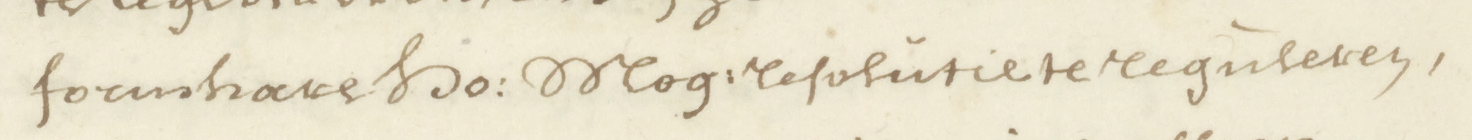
form hare Ho:Mog: resolutie te reguleren,
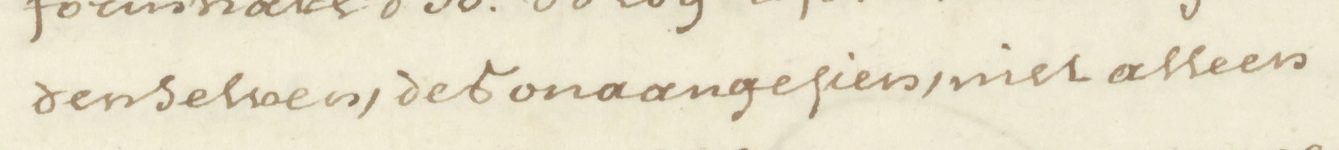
denselven, desonaangesien, niet alleen
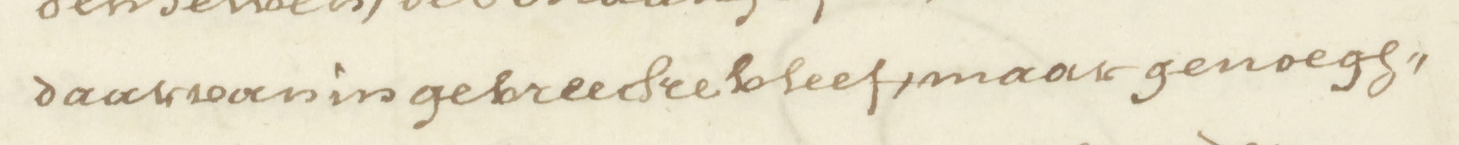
daarvan in gebreecke bleef, maar genoegh„
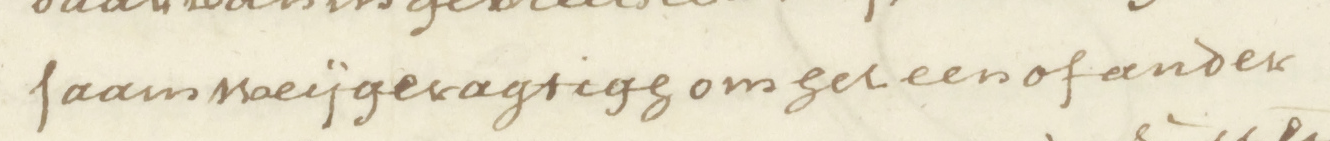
saam weijgeragtigh om het een of ander
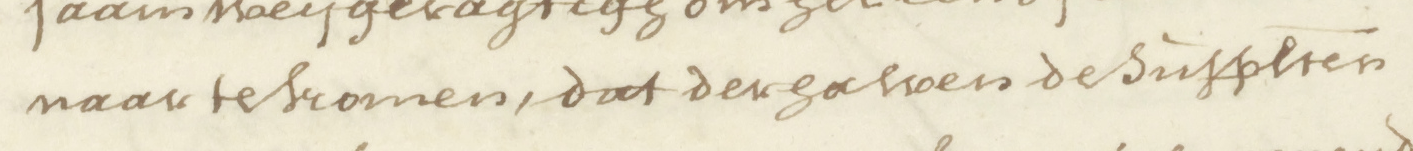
naar te komen, dat derhalven de supplten
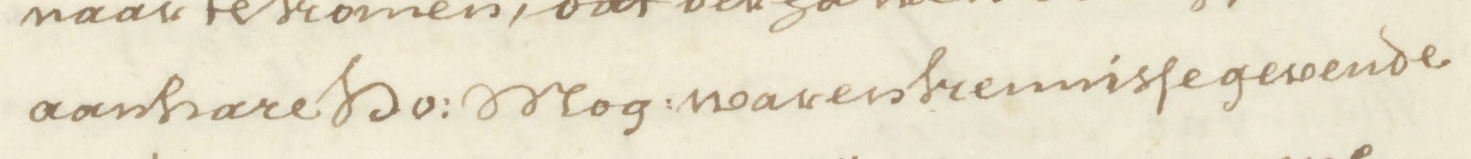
aan hare Ho:Mog: waren kennissegevende
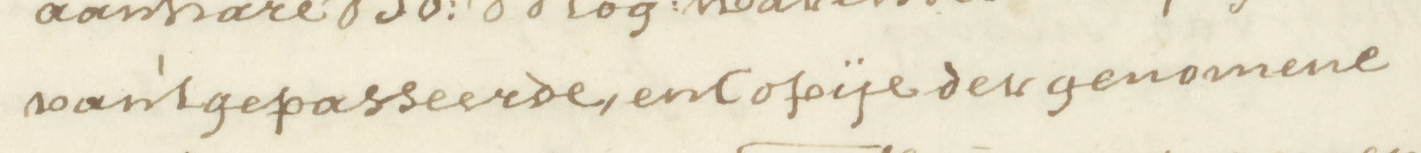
van't gepasseerde, en copije der genomene
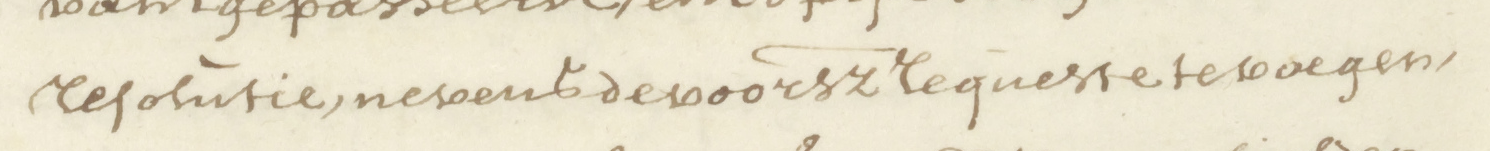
resolutie, nevens de voorsz requeste te voegen.
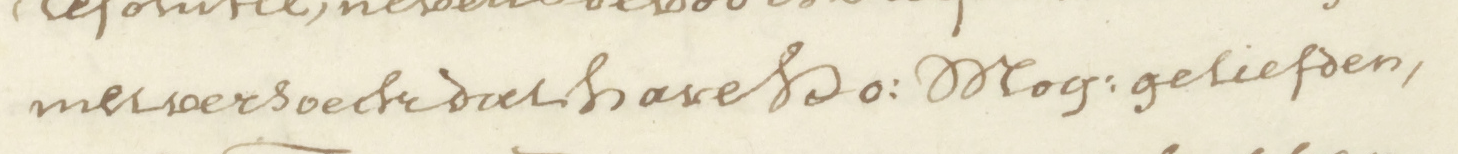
met versoeck dat hare Ho:Mog: geliefden,
